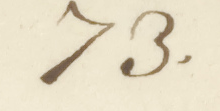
73.
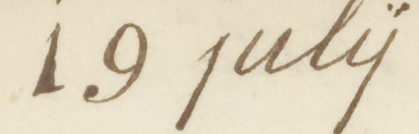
19 julij
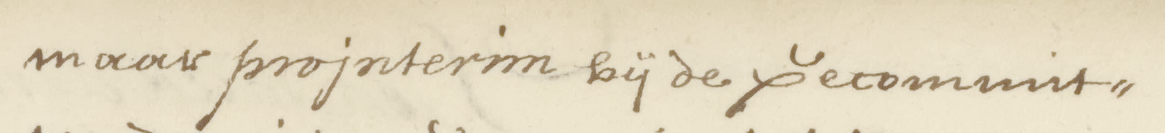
maar prointerim bij de Gecommit„
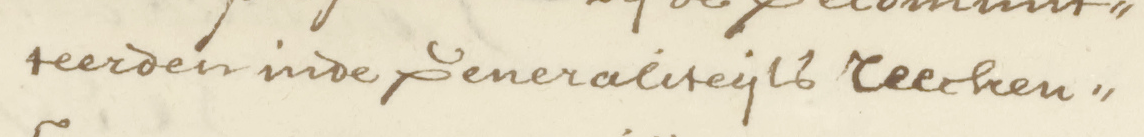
teerden inde Generaliteijts Reecken„
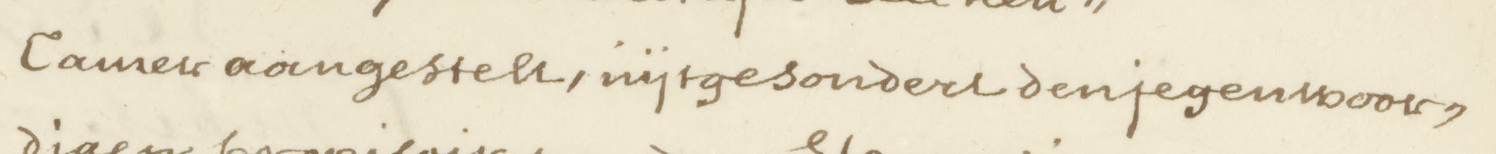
Camer aangestelt, uijtgesondert den jegenwoor„
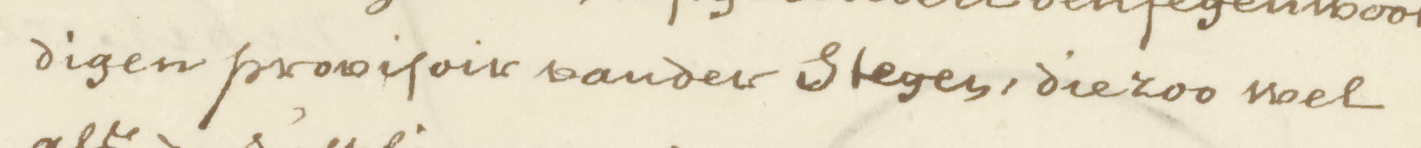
digen provisoir vander Stegen, die zoo wel
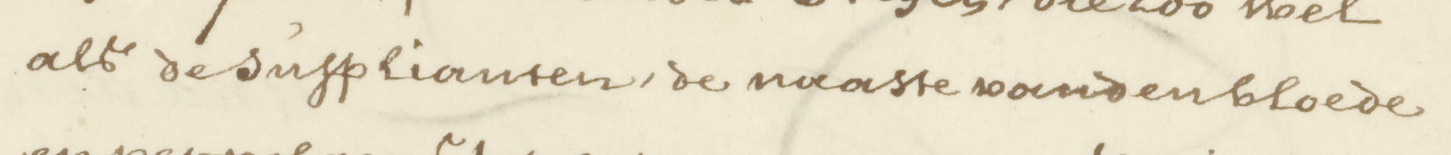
als de supplianten, de naaste vanden bloede
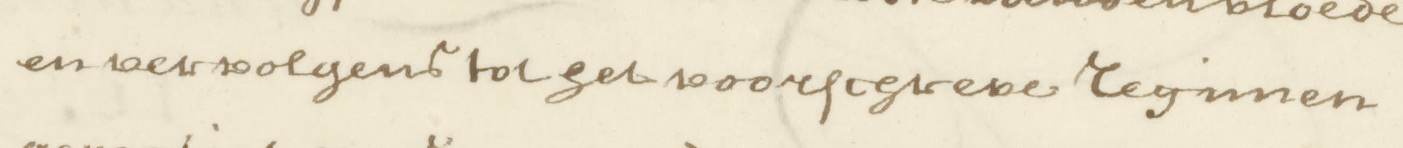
en vervolgens tot het voorschreve Regimen
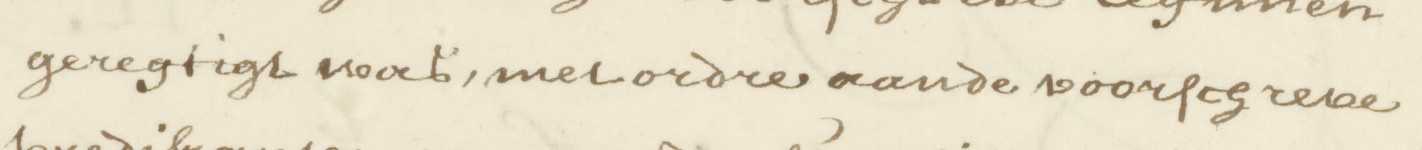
geregtigt was, met ordre aande voorschreve
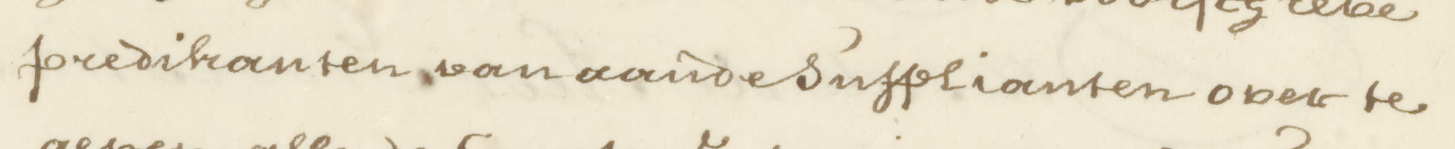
predikanten van aande supplianten over te
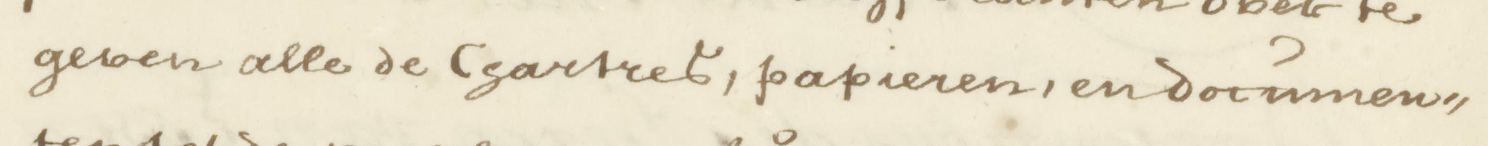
geven alle de Chartres, papieren en documen„
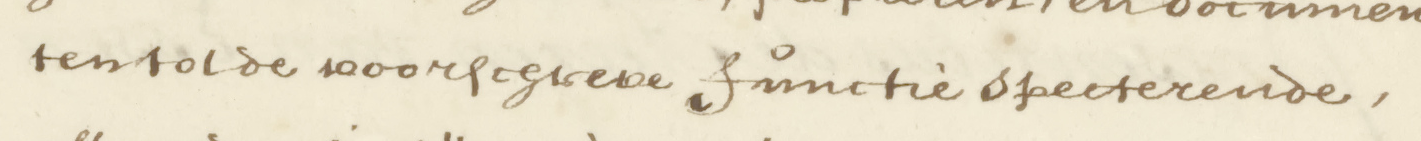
ten tot de voorschreve functie specterende,
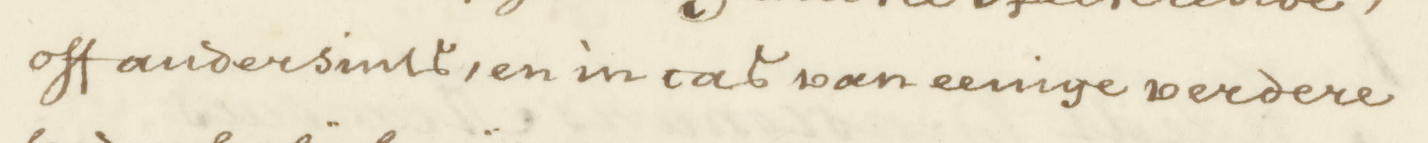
off andersints en in cas van eenige verdere
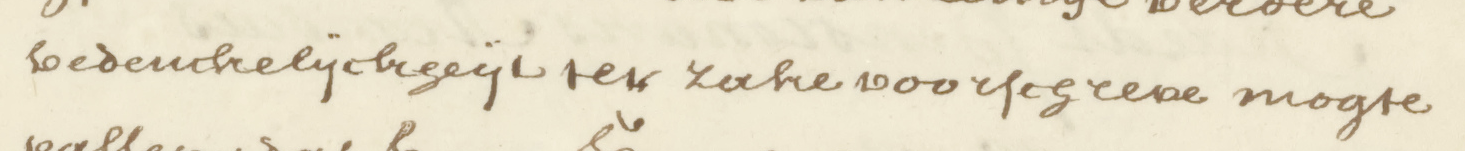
bedenckelijkheijt ter zake voorschreve mogte
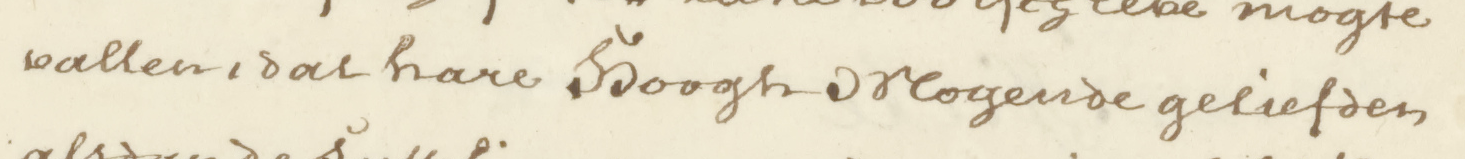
vallen, dat hare Hoogh Mogende geliefden
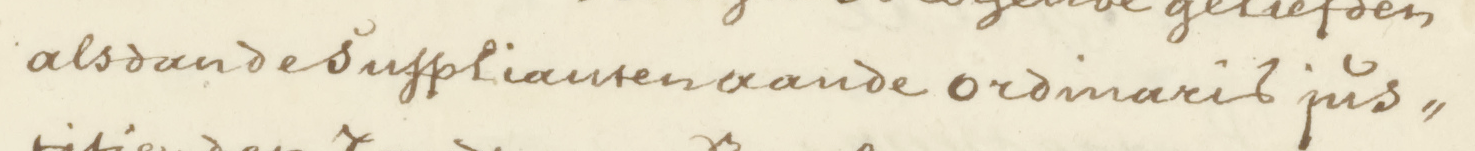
alsdan de supplianten aande ordinaris jus„
